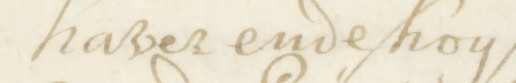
haver ende hoy
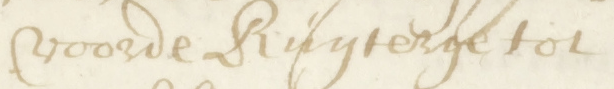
voorde Ruyterye tot
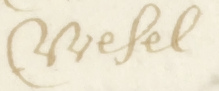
Wesel
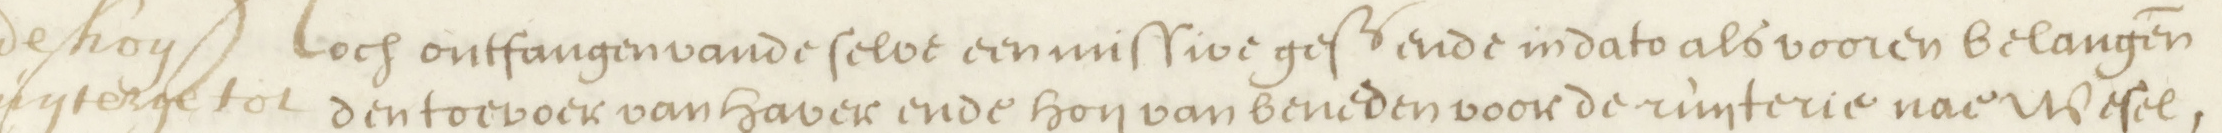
Noch ontfangen vande selve een missive ges ende in dato als vooren belangen
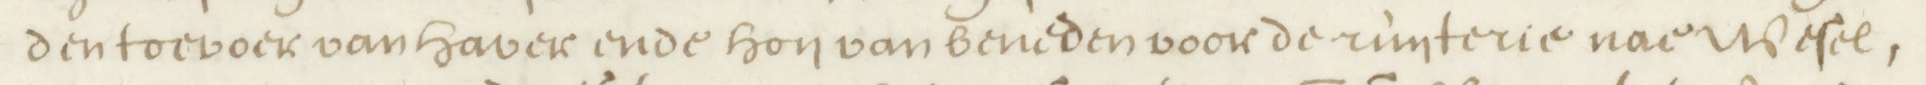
den toevoer van haver ende hoy van beneden voor de ruyterie nae Wesel,
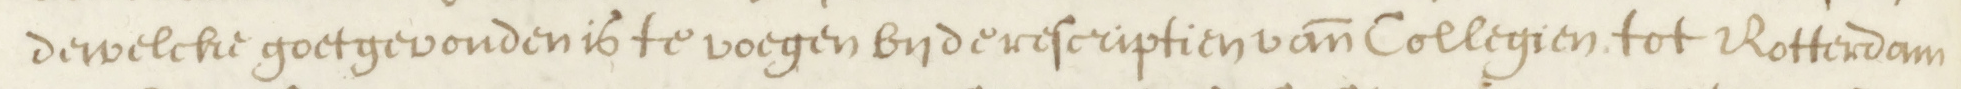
dewelcke goetgevonden is te voegen by de rescriptien van Collegien tot Rotterdam
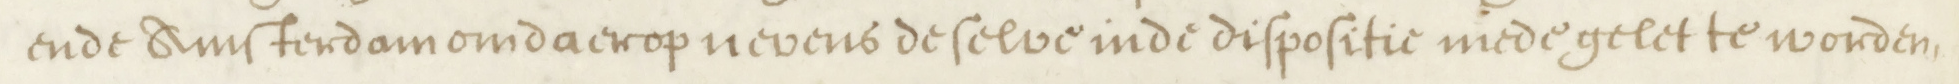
ende Amsterdam om daerop nevens deselve inde dispositie mede gelet te worden.
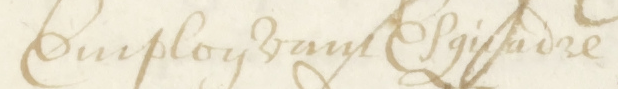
Employ vant Esquadre
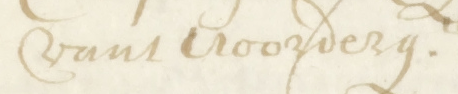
vant Noorderq.
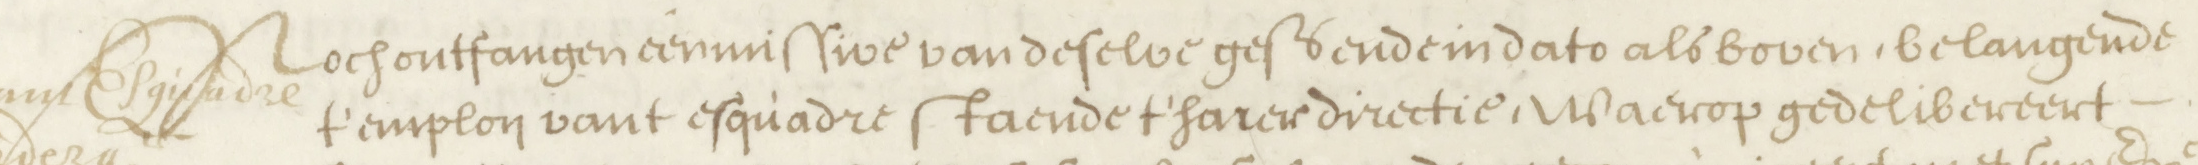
Noch ontfangen een missive van deselve ges ende in dato als boven, belangende
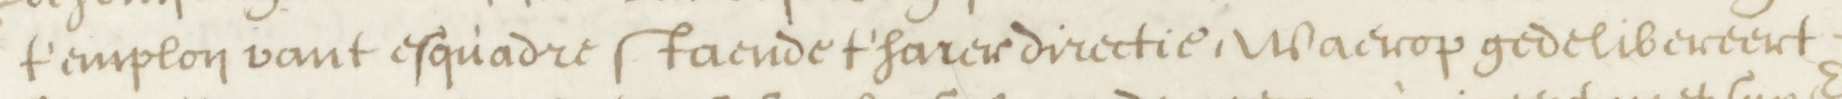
t'employ vant esquadre staende t' harer directie. Waerop gedelibereert
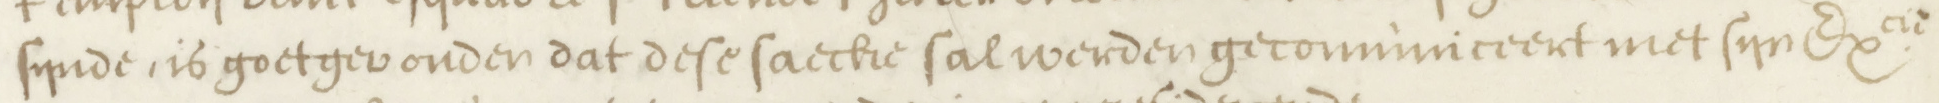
synde, is goetgevonden dat dese saecke sal werden gecomuniceert met syn Excie.
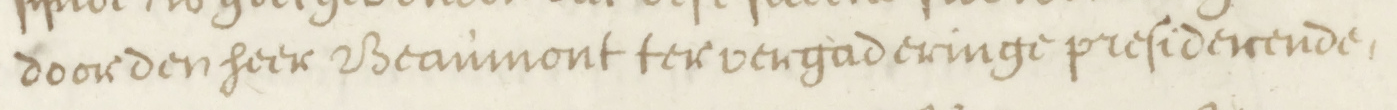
door den heer Beaumont ter vergaderinge presiderende.
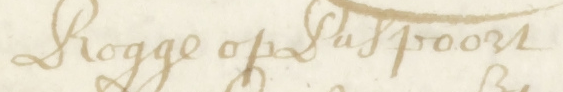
Rogge op Paspoort
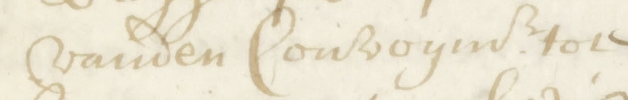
vanden Convoymr. tot
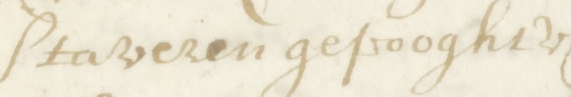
Staveren gepooght vuyt
